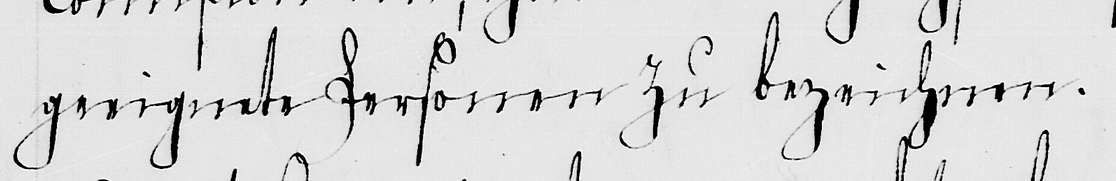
geeignete Personen zu bezeichnen.
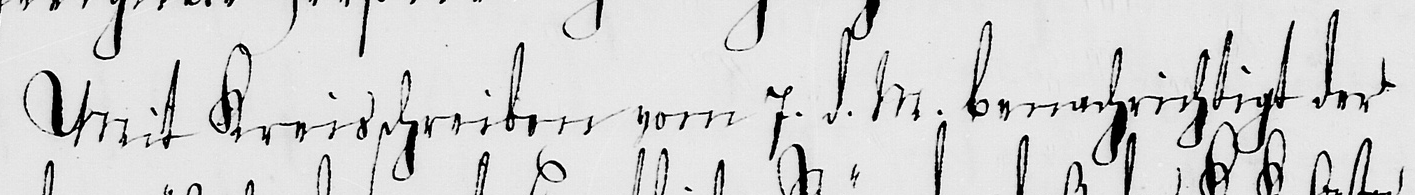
Mit Kreisschreiben vom 7. d. M. benachrichtigt der
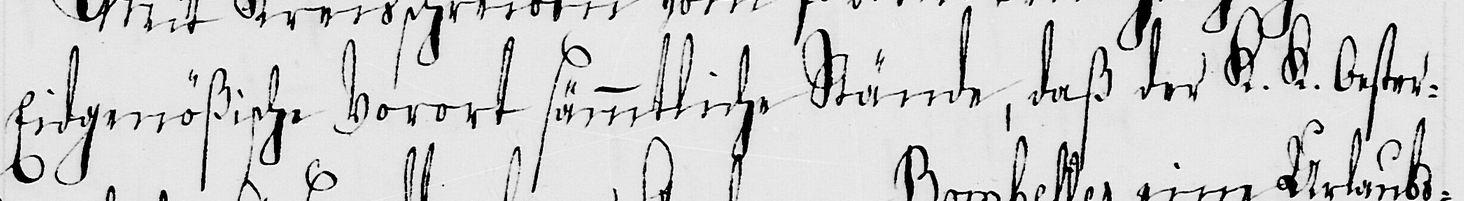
Eidgenößische Vorort sämmtliche Stände, daß der K. K. Oeste¬
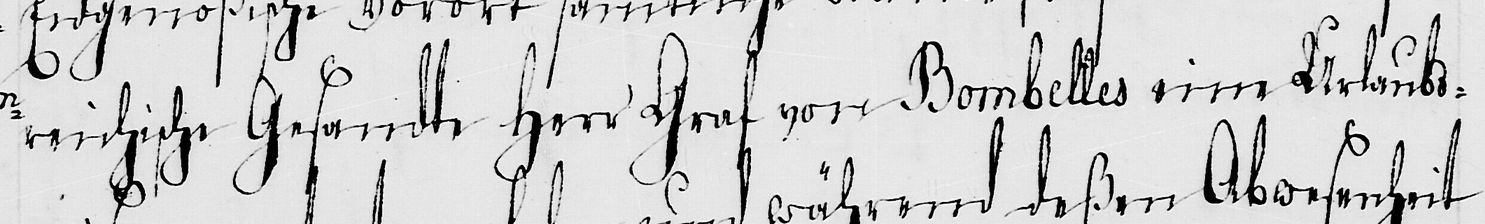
reichische Gesandte Herr Graf von Bombelles eine Urlaubs¬
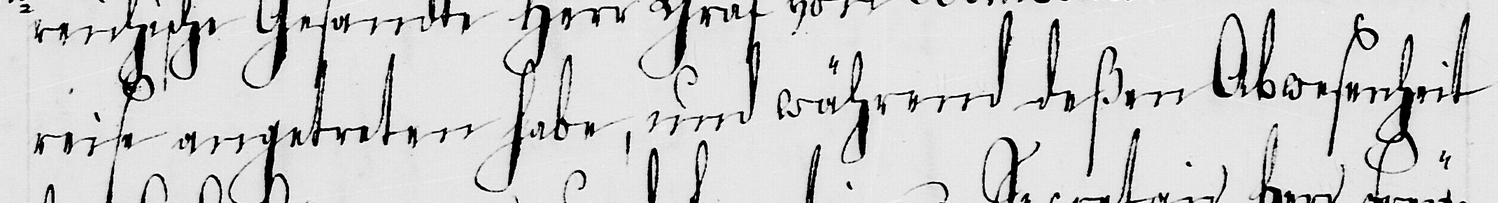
reise angetreten habe, und während deßen Abwesenheit
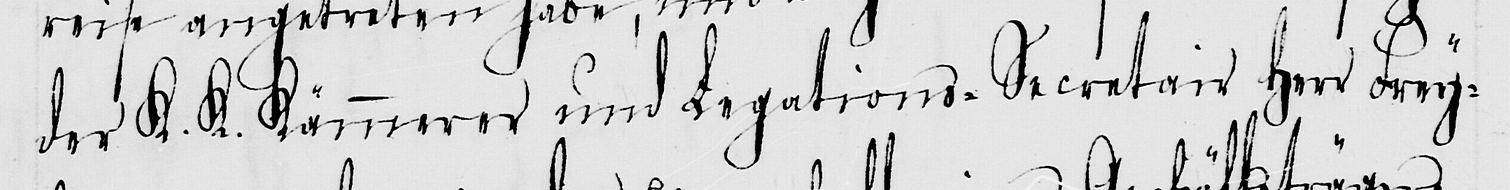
der K. K. Kämmerer und Legations-Secretair Herr Frey¬
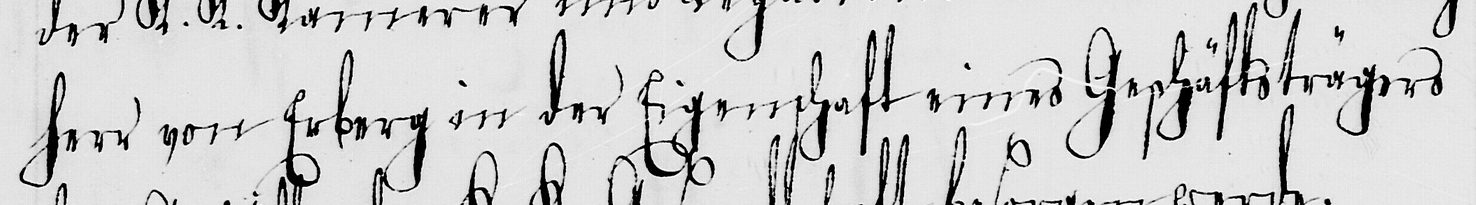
herr von Erberg in der Eigenschaft eines Geschäftsträgers
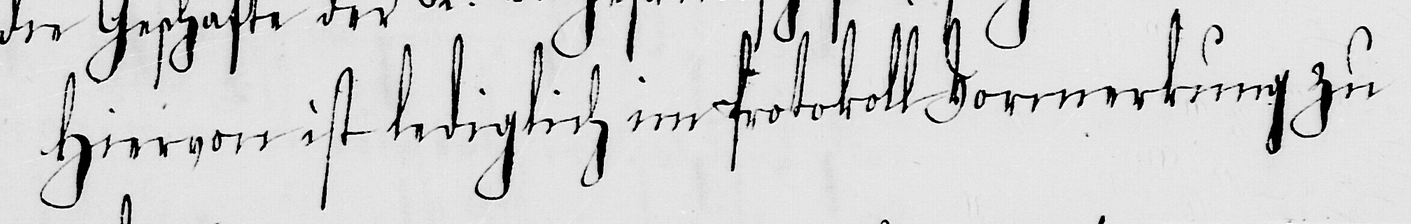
Hiervon ist lediglich im Protokoll Vormerkung zu
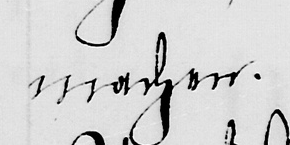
machen.
